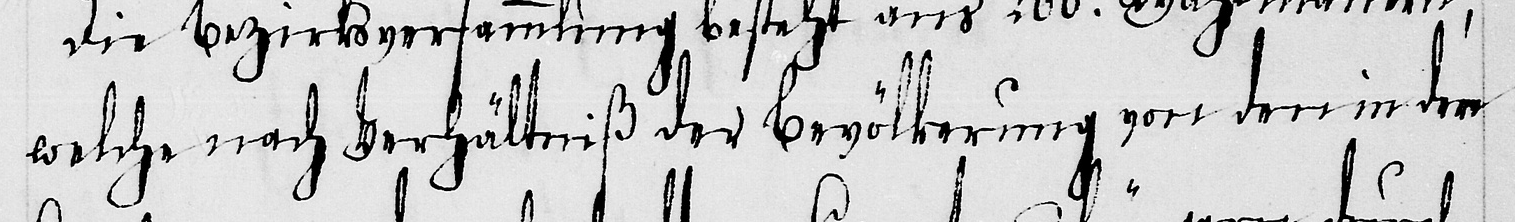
welche nach Verhältniß der Bevölkerung von den in der
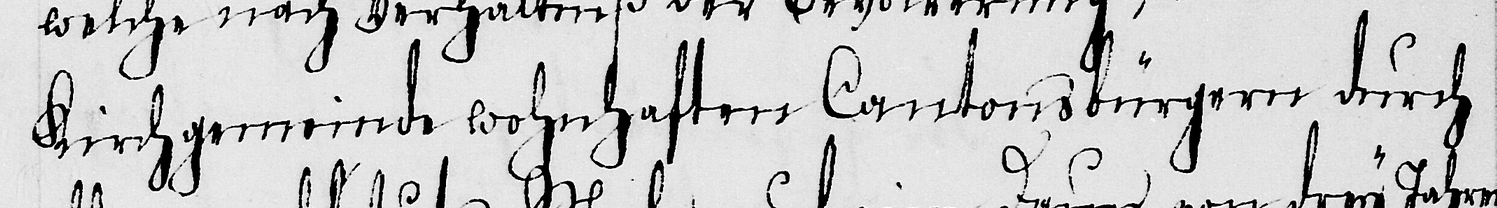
Kirchgemeinde wohnhaften Cantonsbürgern durch
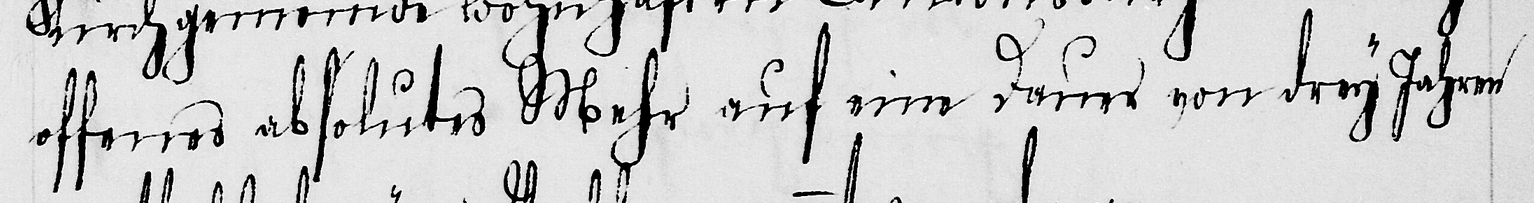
offenes absolutes Mehr auf eine Dauer von drey Jahren
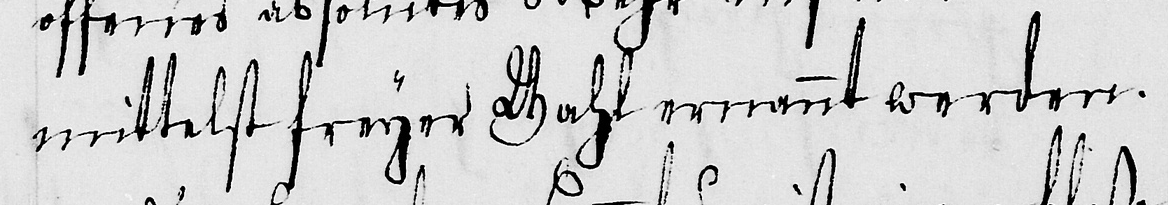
mittelst freyer Wahl ernannt werden.
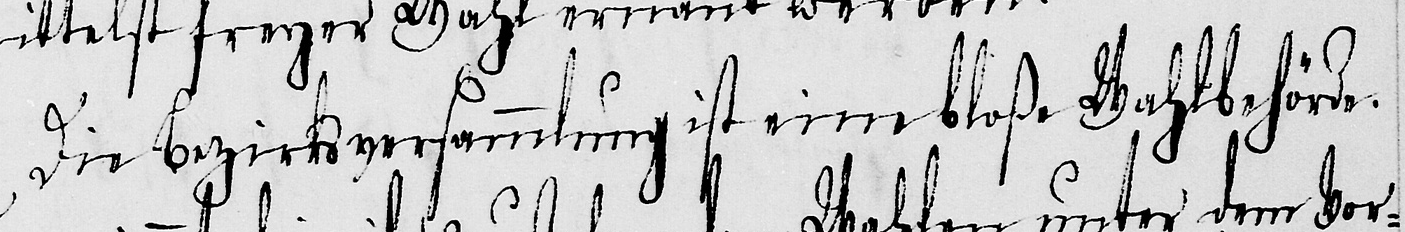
Die Bezirksversammlung ist eine bloße Wahlbehörde.
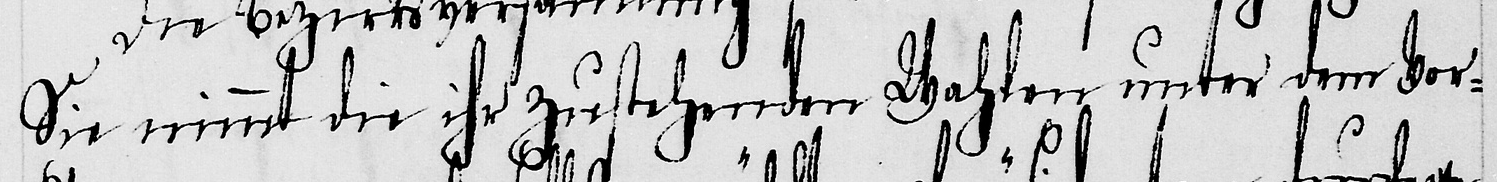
Sie nimmt die ihr zustehenden Wahlen unter dem Vor¬
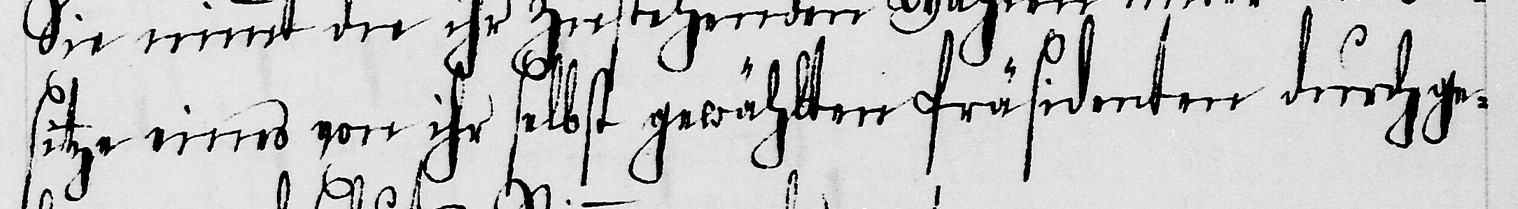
sitze eines von ihr selbst gewählten Präsidenten durch ge¬
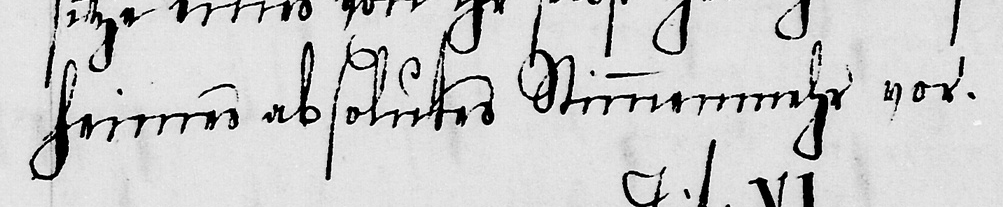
heimes absolutes Stimmenmehr vor.
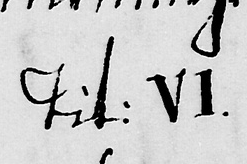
Tit: VI.
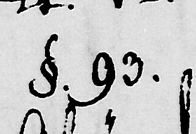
§. 93.
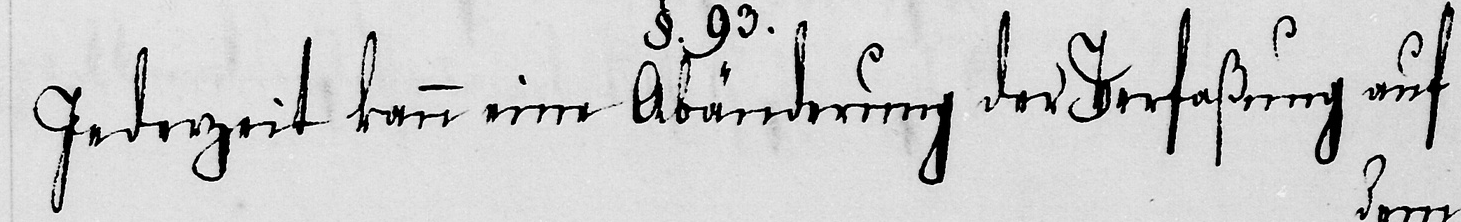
Jederzeit kann eine Abänderung der Verfaßung auf
